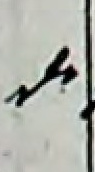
do
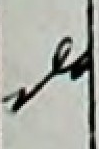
do
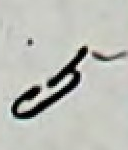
5
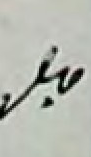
do
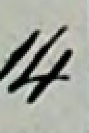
14
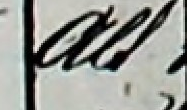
Alt
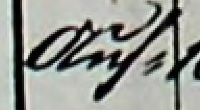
Aus=
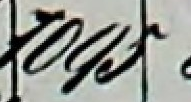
1095
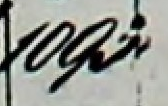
1095
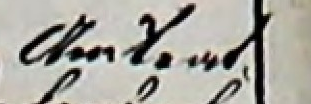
Am Reat
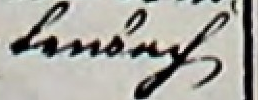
tenbach
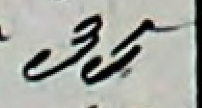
35
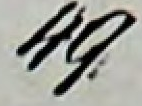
49
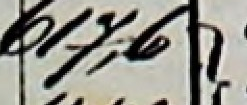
617,6
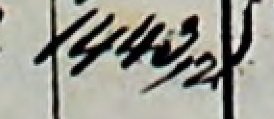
1443,2
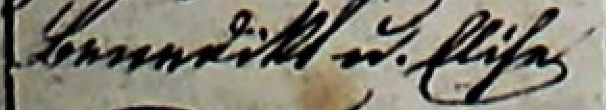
Benedikt u. Elise
